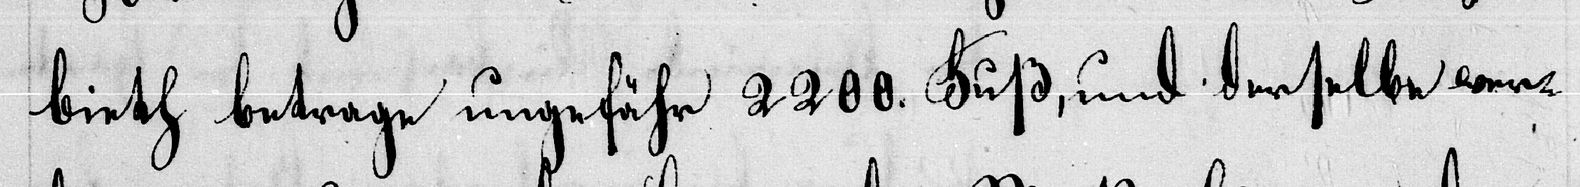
biet betrage ungefähr 2200. Fuß, und derselbe wer¬
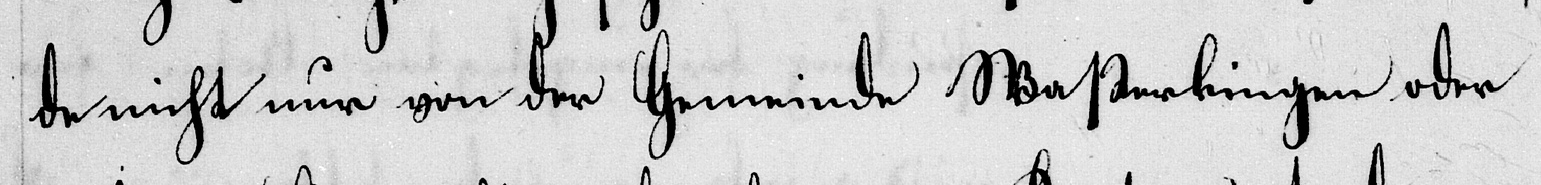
de nicht nur von der Gemeinde Wasterkingen oder
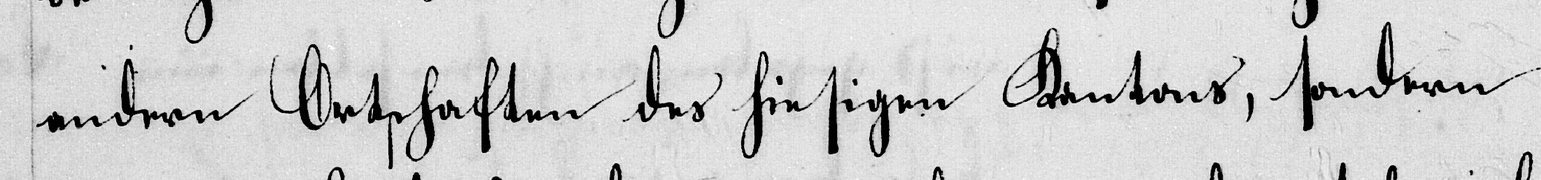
andern Ortschaften des hiesigen Kantons, sondern
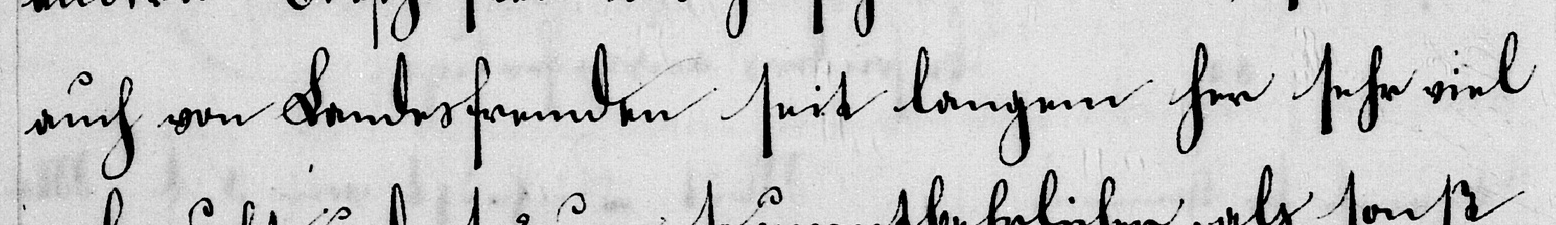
auch von Landesfremden seit langem her sehr viel
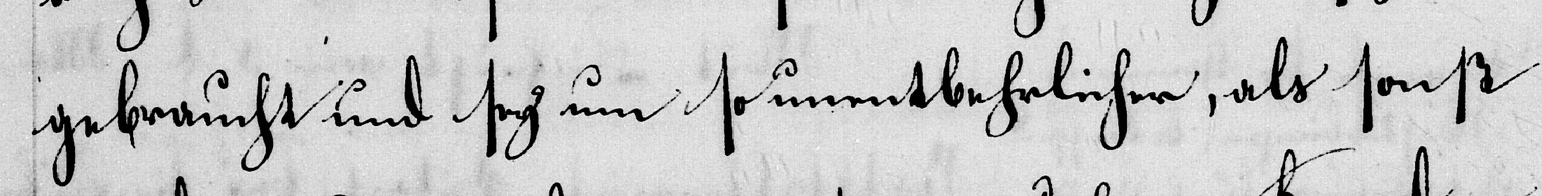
gebraucht und sey um so unentbehrlicher, als sonst
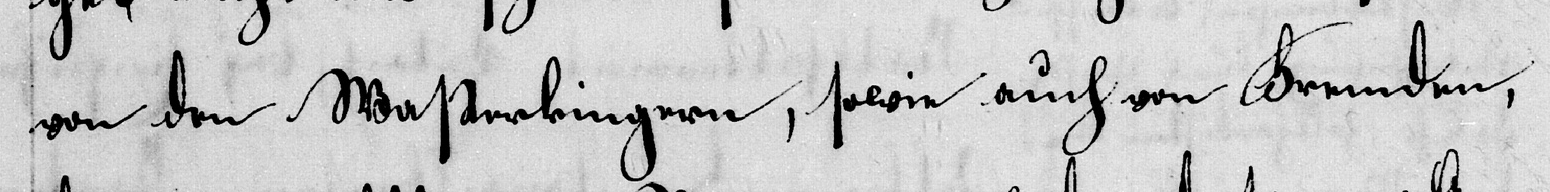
von den Wasterkingern, sowie auch von Fremden,
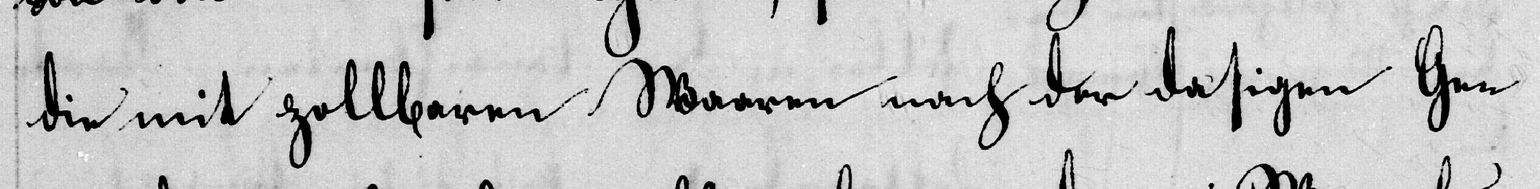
die mit zollbaren Waaren nach der dasigen Ge¬
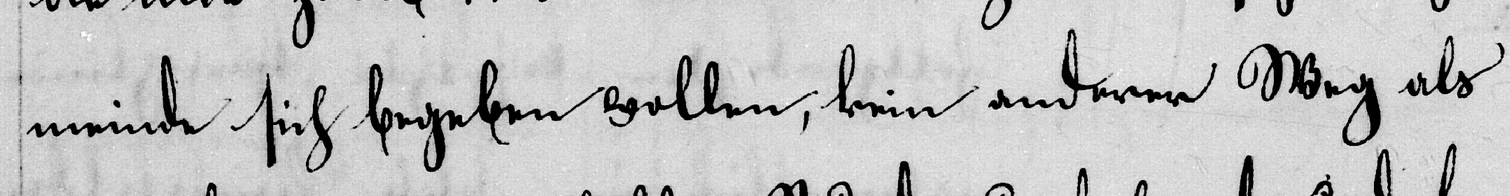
meinde sich begeben wollen, kein anderer Weg als
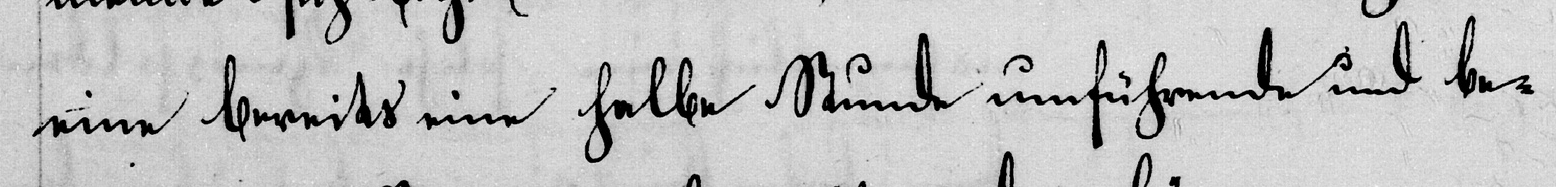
eine bereits eine halbe Stunde umführende und be¬
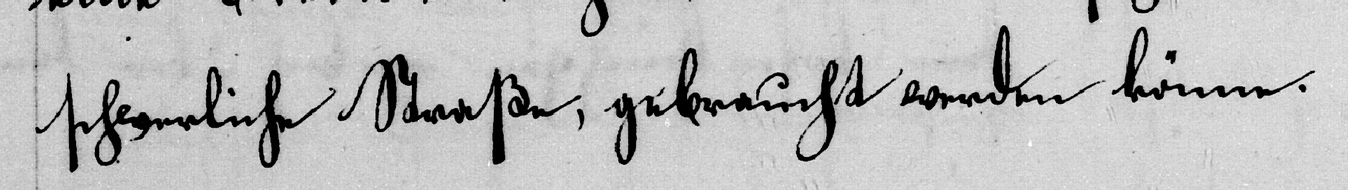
schwerliche Straße, gebraucht werden könne.
